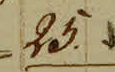25.
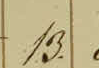13.
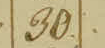30.
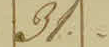31.
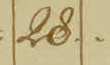28.
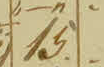15.
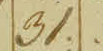31.
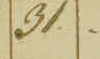31.
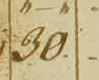30.
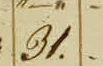31.
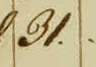31.
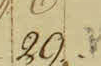29.
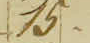15
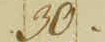30
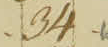34
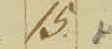15.
